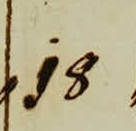18
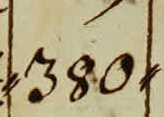380
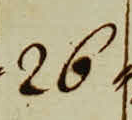26
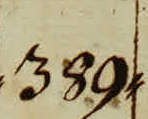389
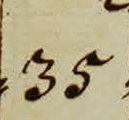35
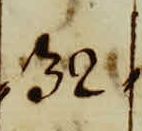32
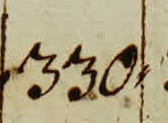330
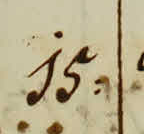15:
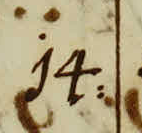14:
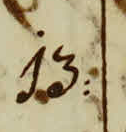13:
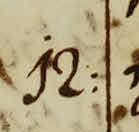12:
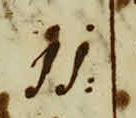11:
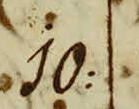10:
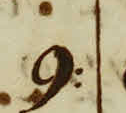9:
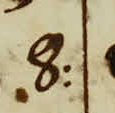8:
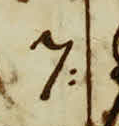7:
